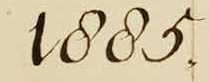1885
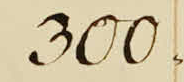300
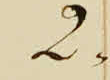2
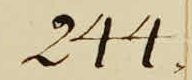244
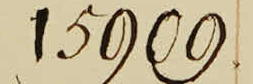15909
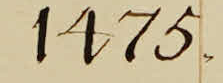1475
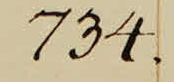734
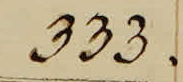333
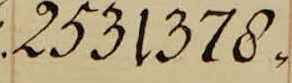2531378
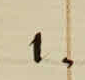1
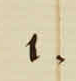1
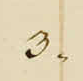3
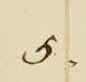5
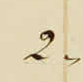2
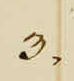3
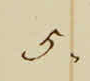5
